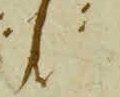1:
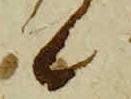2
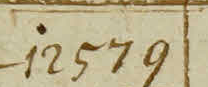12579
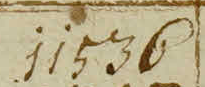11536
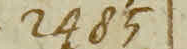2485
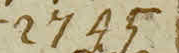2745
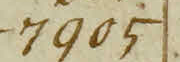7905
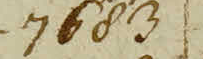7683
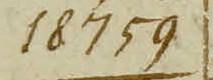18759
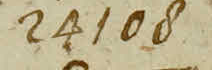24108
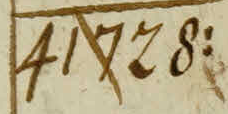41728
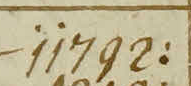11792
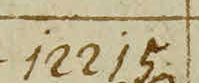12215
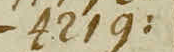4219
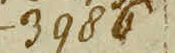3986
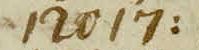12017
